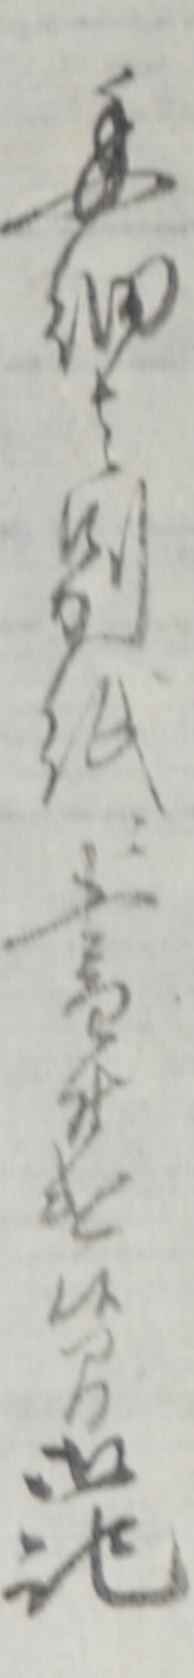委細は別紙ニ書付遣候間御記
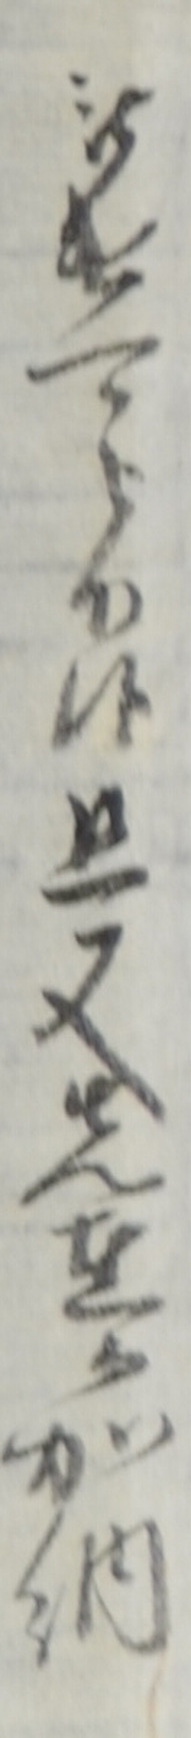被遣可被下候且又先達而加納
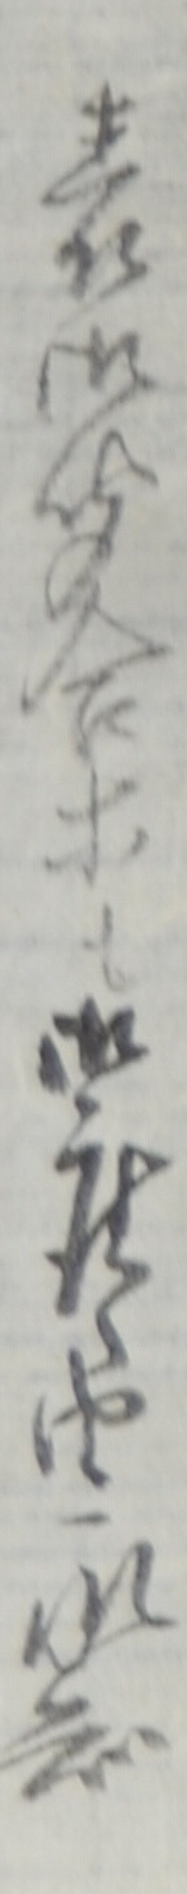表御聞合等も御座候由承知
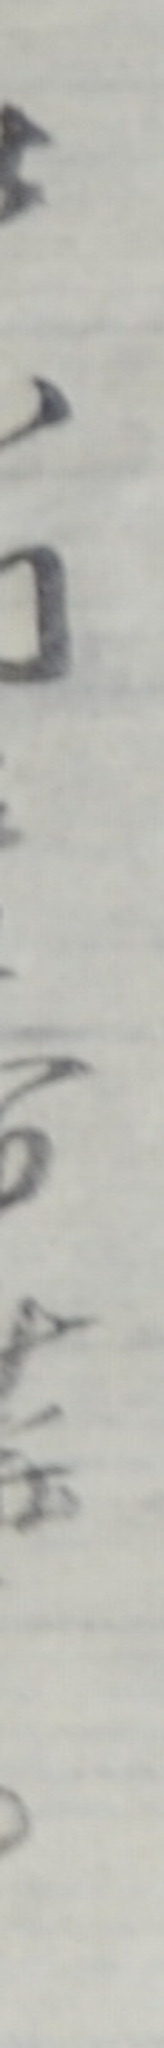仕候加納表御賄料并御音物等

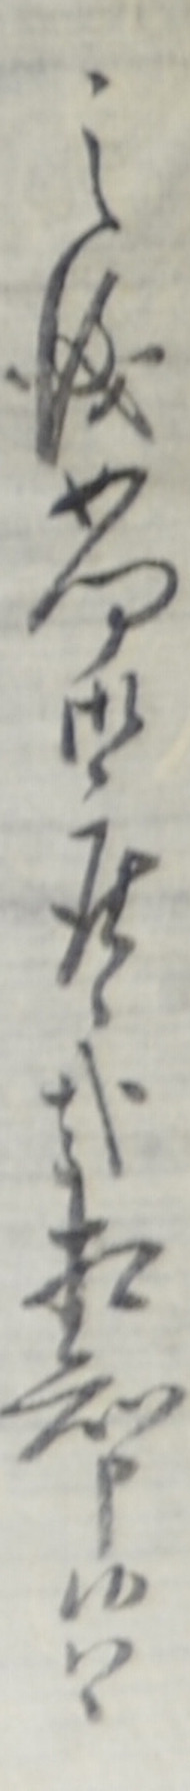之儀如何御座候哉相知申候ハヽ
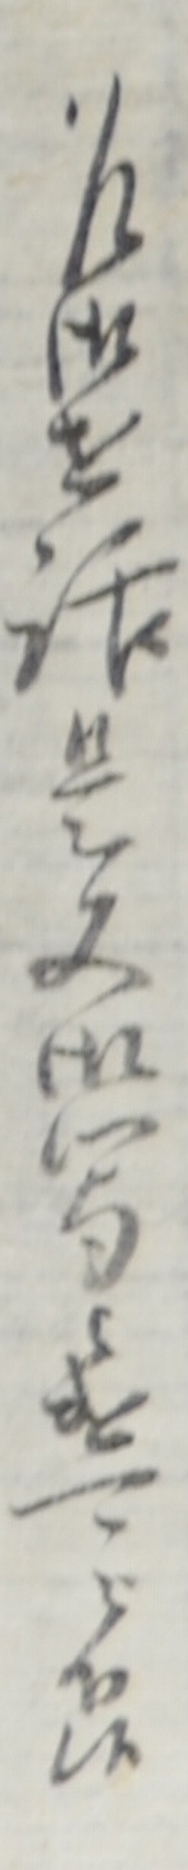乍御遣世話是又御写被遣可被下候
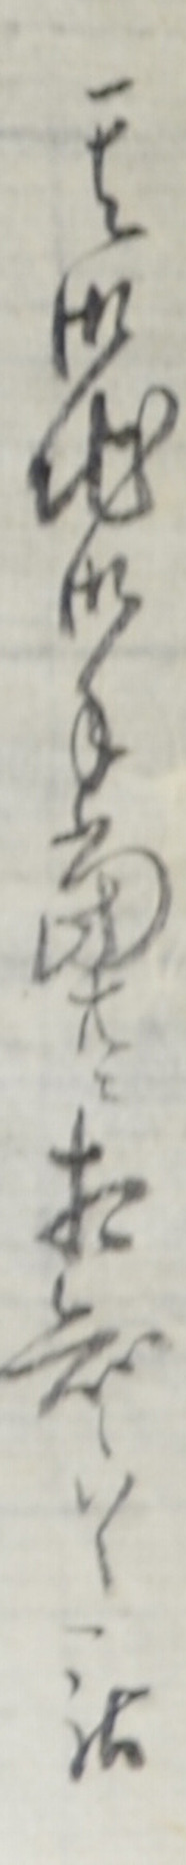其御地御手当共ニ相知候ハヽ被
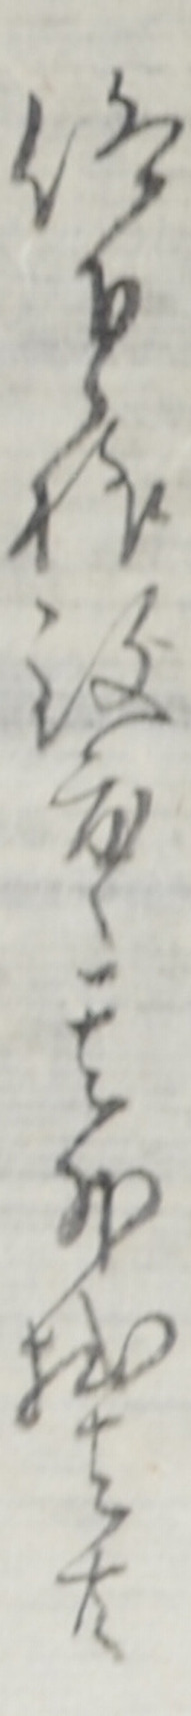仰下候様致度候其外拙者共
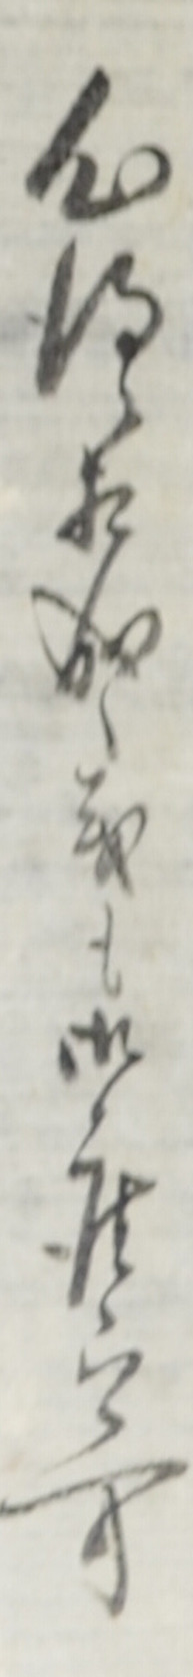心得ニ相成候義も御座候ハヽ可
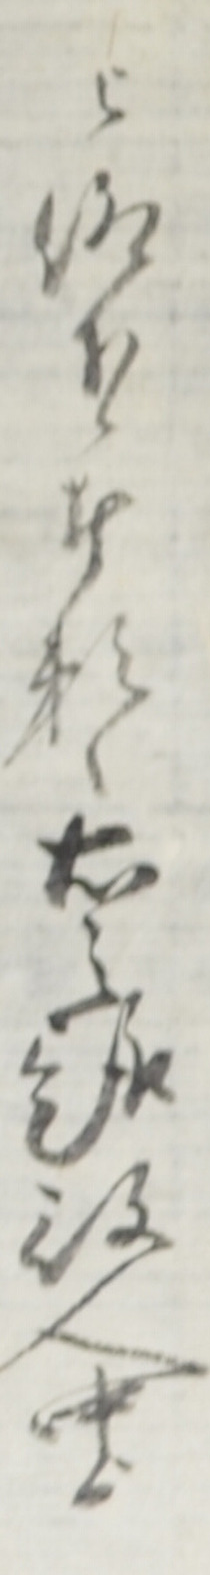被仰下候奉頼候右之趣役人中ゟ
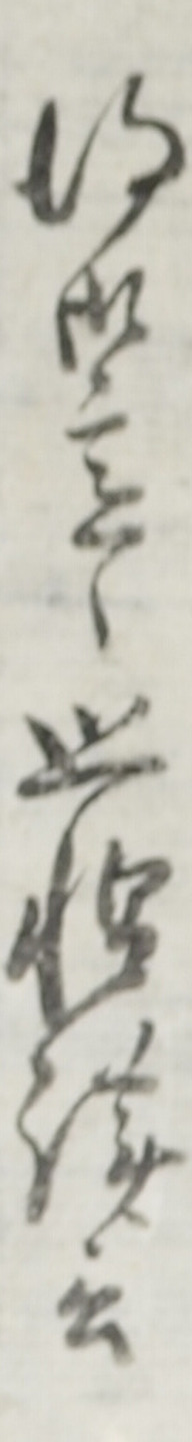得御意候恐惶謹言
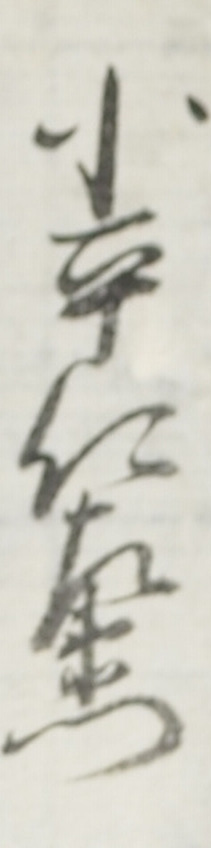小平仁左衛門
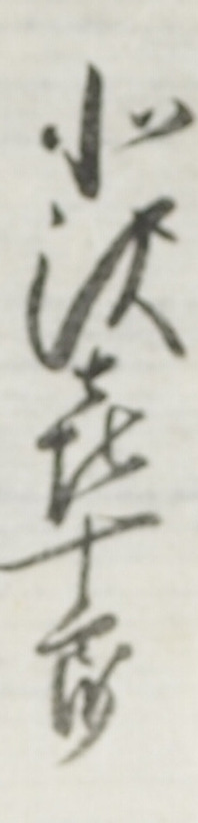北沢喜十郎
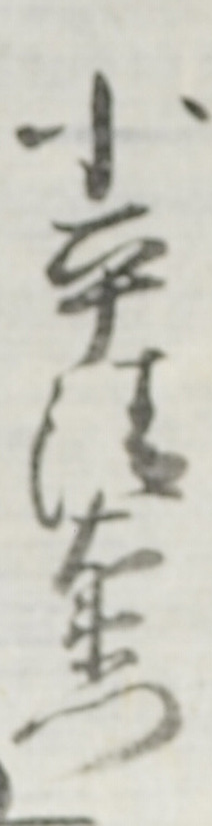小平清右衛門
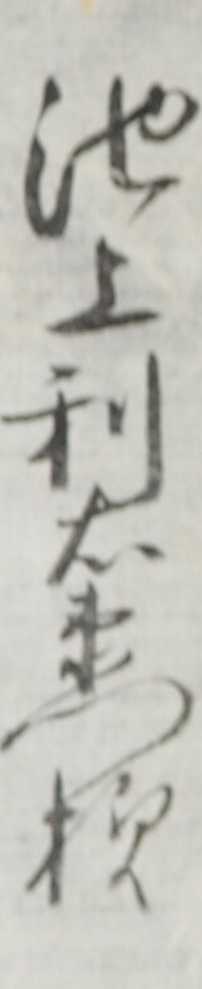池上利右衛門様
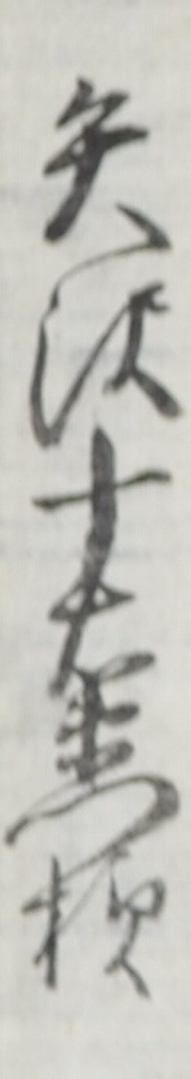矢沢十右衛門様
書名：（書状）
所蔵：伊那市立高遠町図書館・合同会社AMANE
